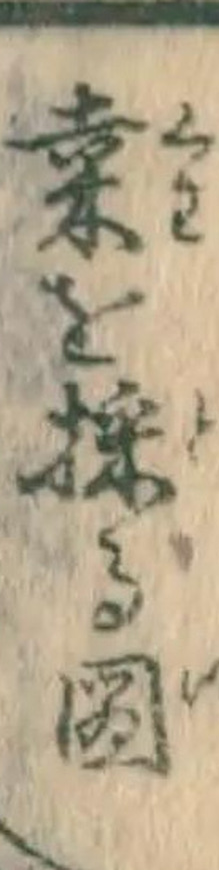桑を採る図
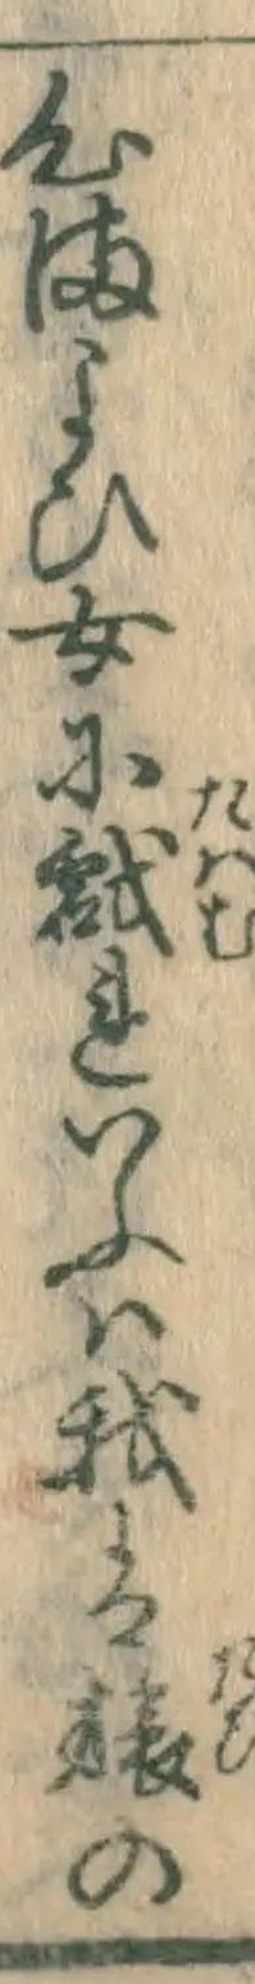心まよひ女に戯れいふは我は旅の
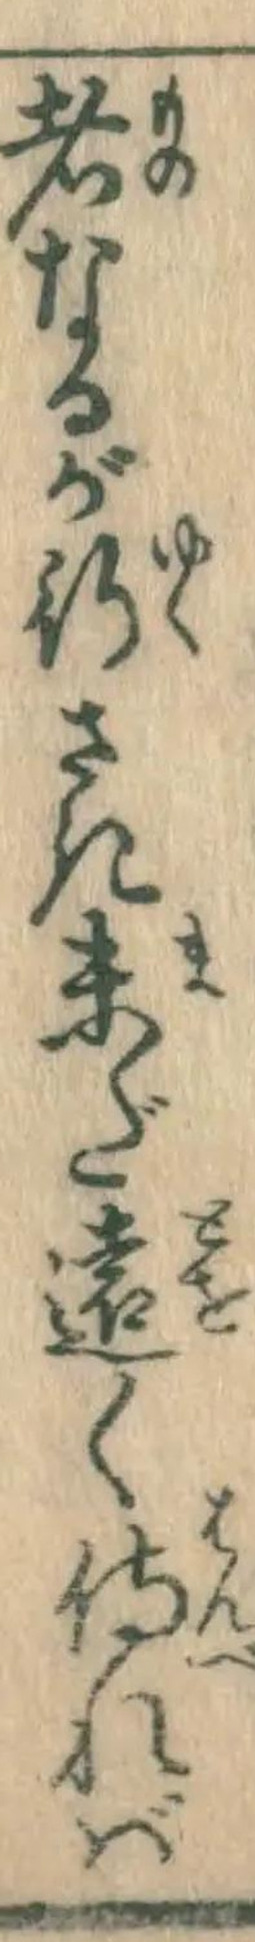者なるが行さき未だ遠く侍れば
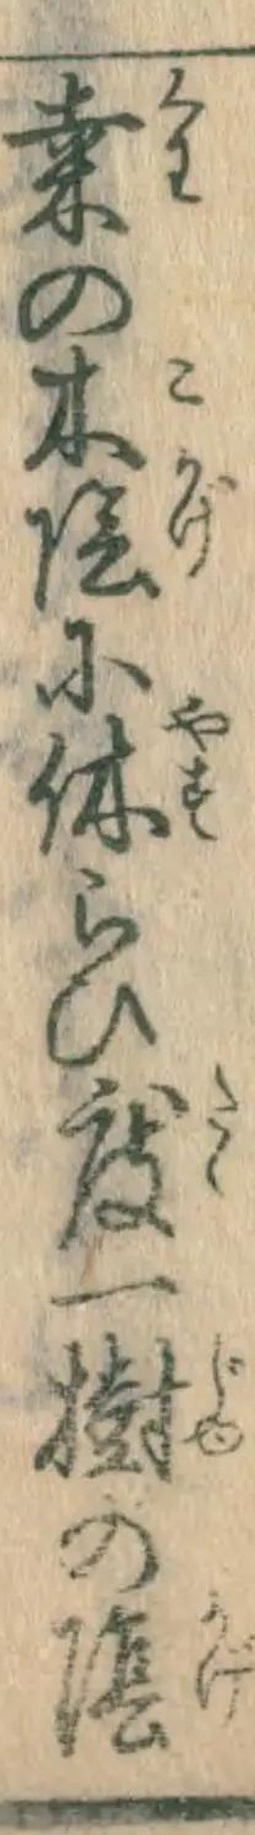桑の木陰に休らひ度一樹の陰
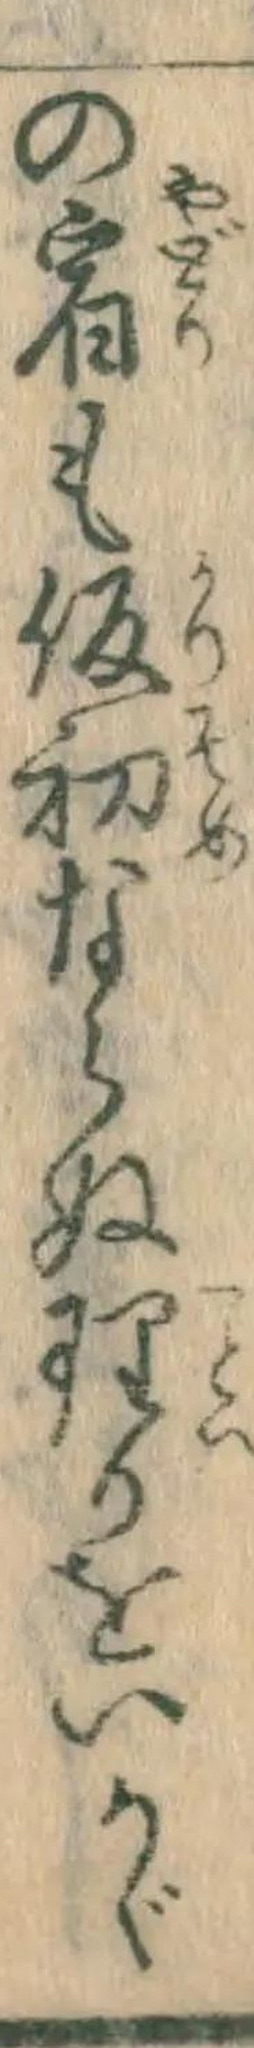の宿も仮初ならぬ理りをいかゞ
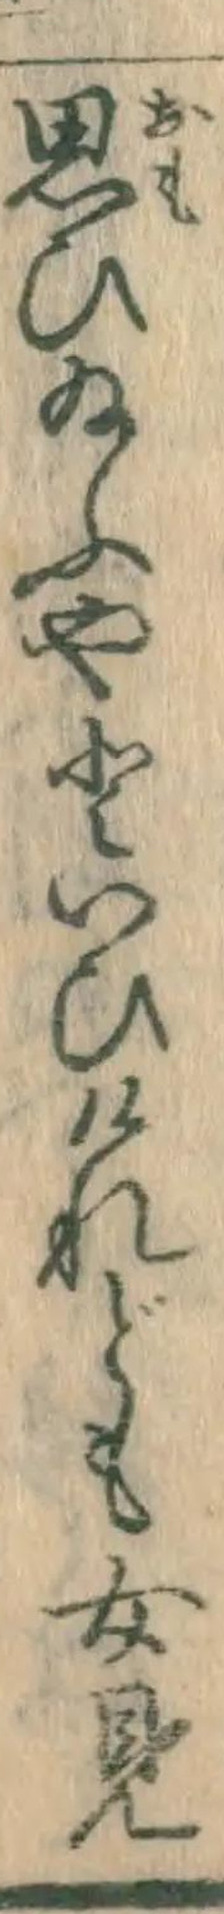思ひ給ふやといひけれども女見
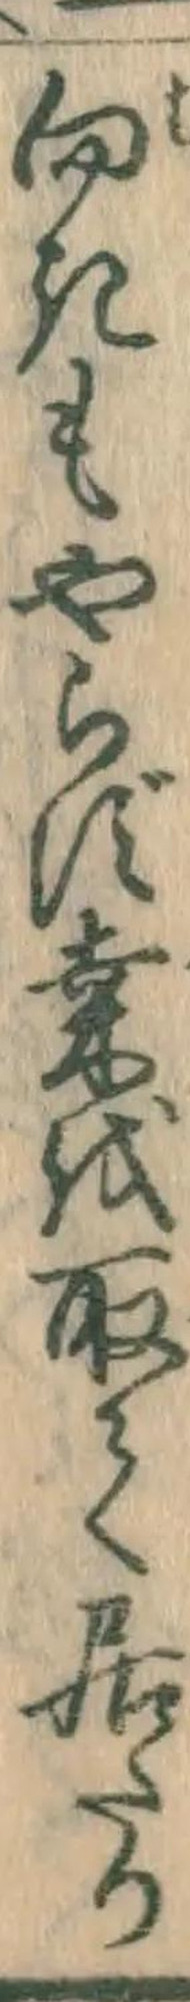向きもやらず桑を取て居たり
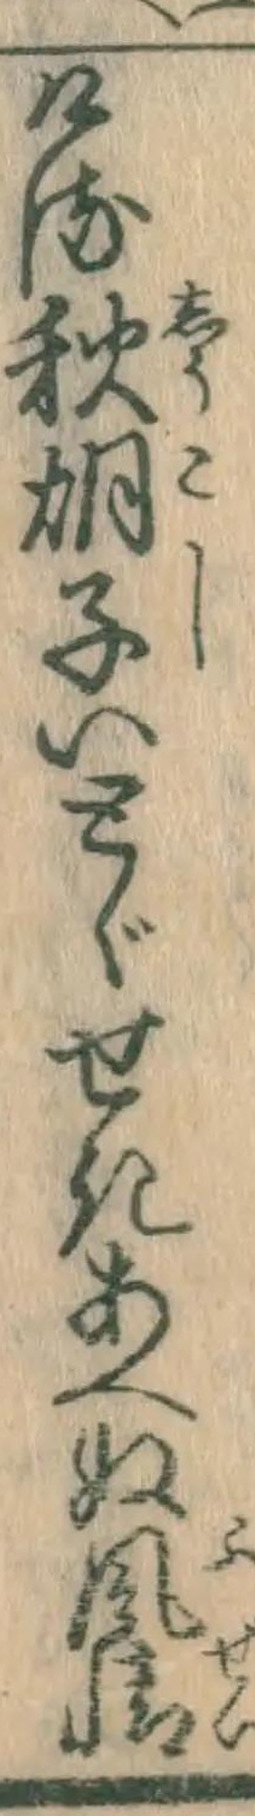ける秋胡子いとゞせきあへぬ風情
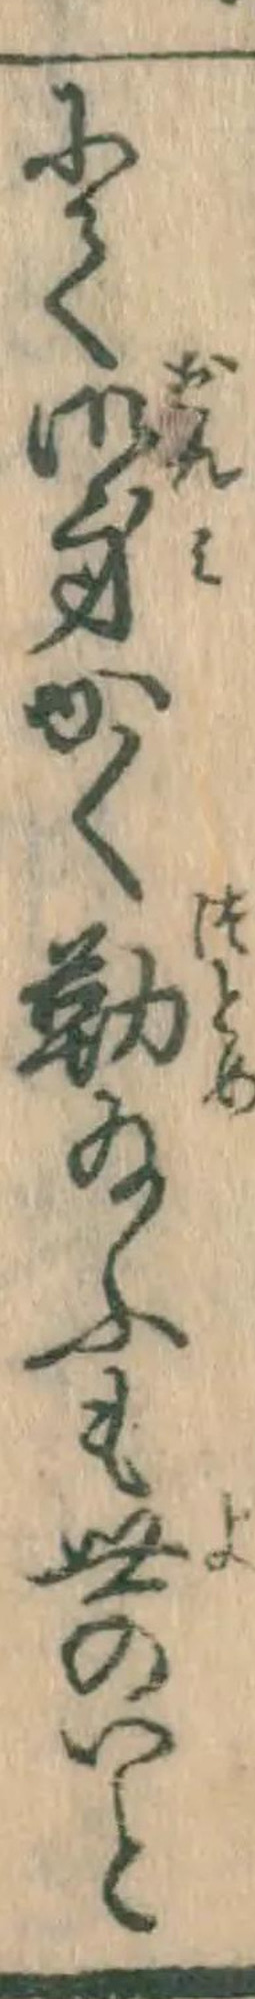にて御身かく勤給ふも世のいと
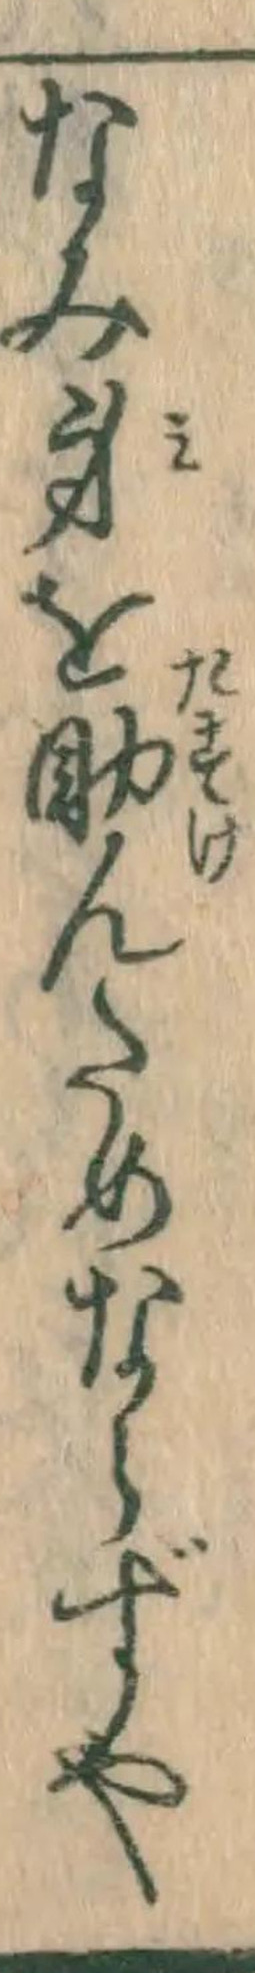なみ身を助んためならずや
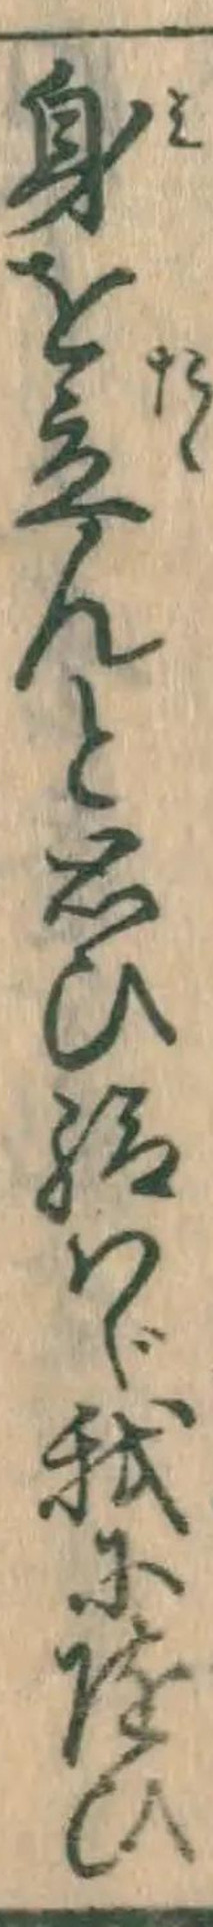身を立んと思ひ給はゞ我に随ひ
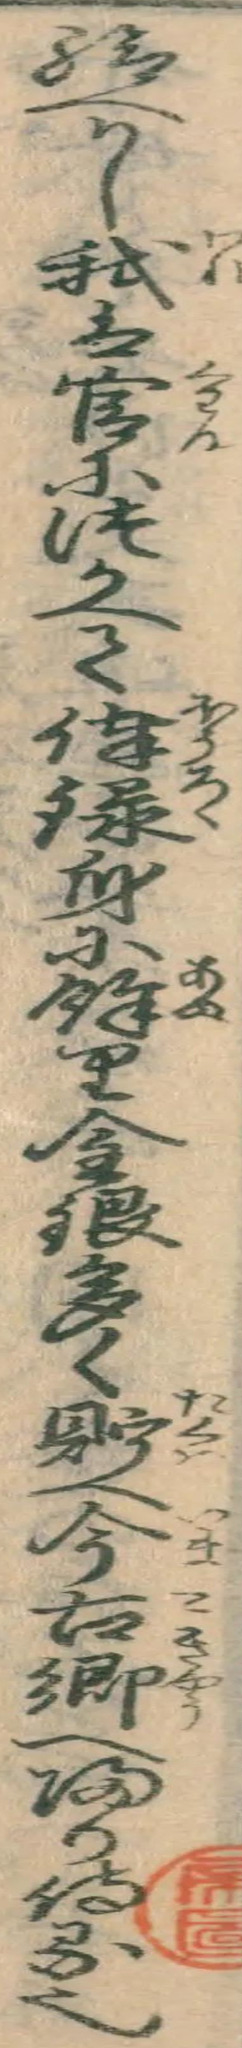給へかし我は官につかへて俸錄身に余り金銀多く貯へ今古郷へ帰り侍る也
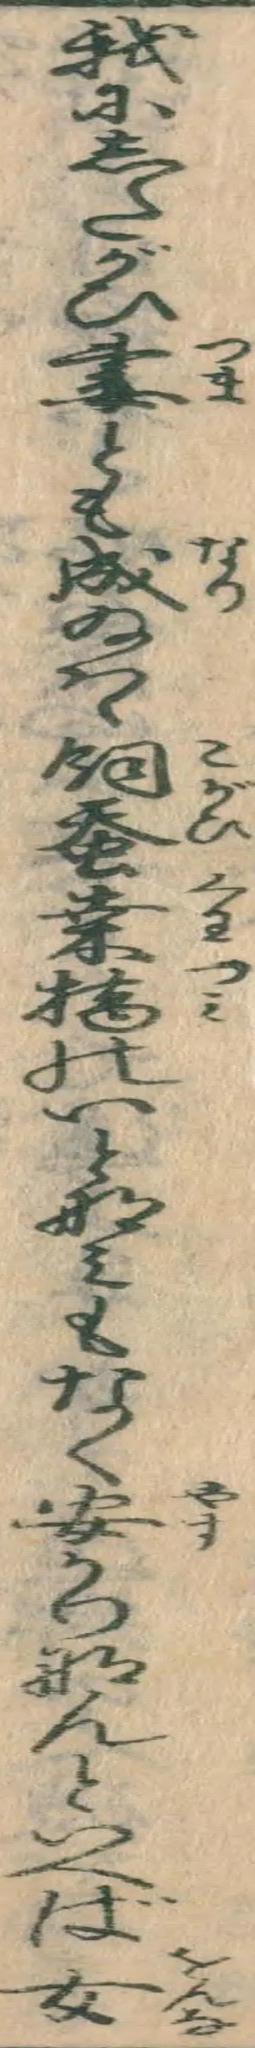我にしたがひ妻とも成給はゝ飼蚕桑摘のいとなみもなく安かりなんといへば女
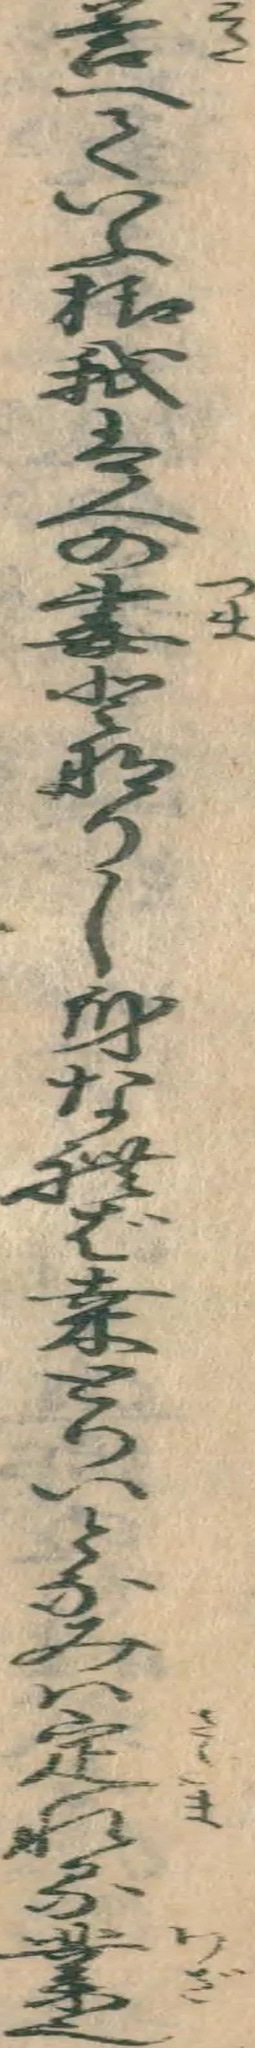答へていふ様我は人の妻となりし身なれば桑とりいとなみは定れる業也
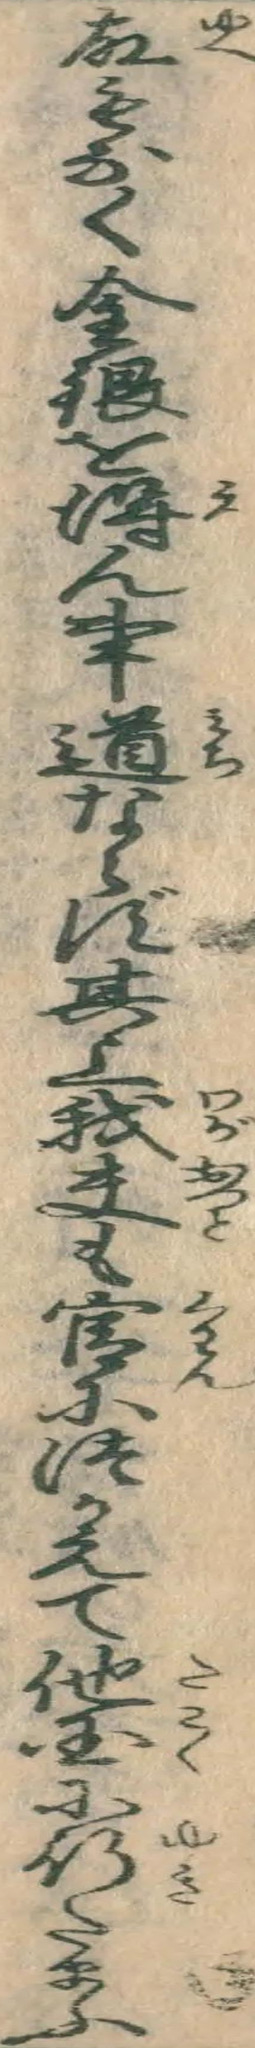故もなく金銀を得ん事道ならず其上我夫も官につかえて他国に行たまふ
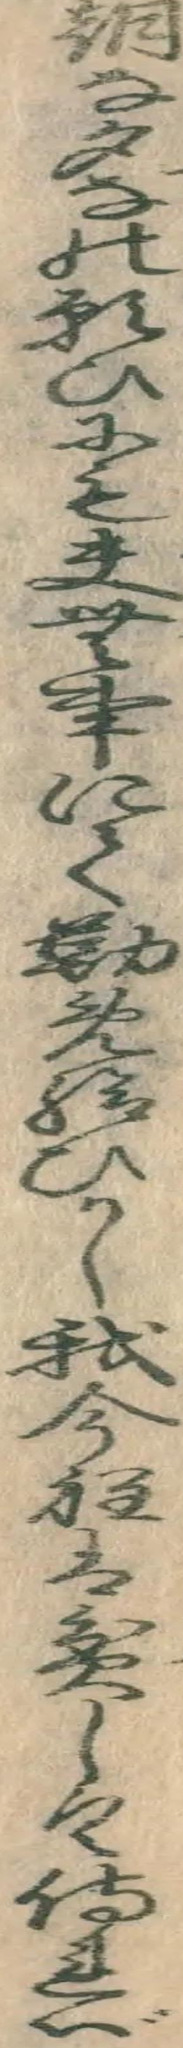朝な夕なの願ひにも夫無事にて勤め給ひかし我今程は貧しく侍れば
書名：養蚕秘録 3巻. [3]
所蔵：国立国会図書館 National Diet Library, JAPAN
